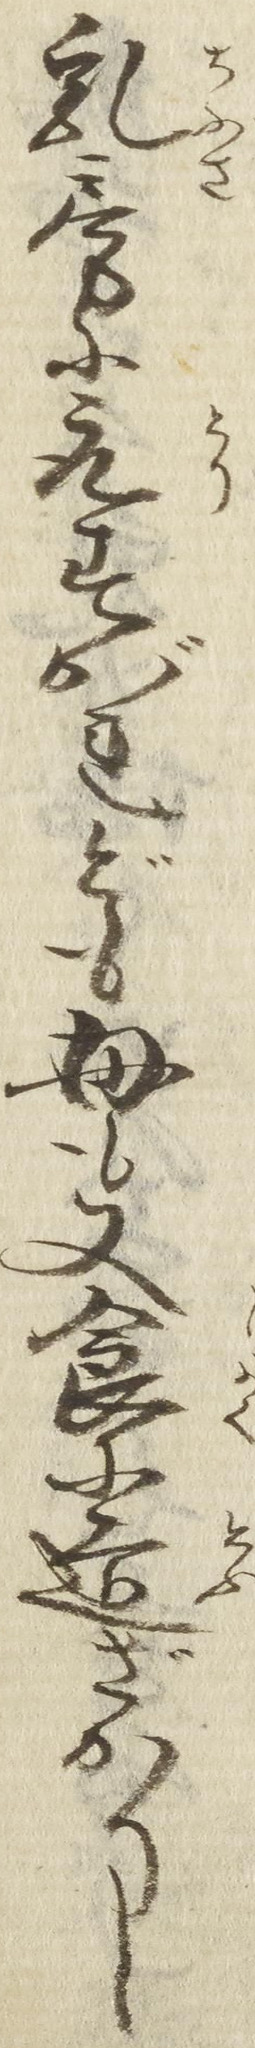乳房に取すがれども母も又食に遠ざかりし

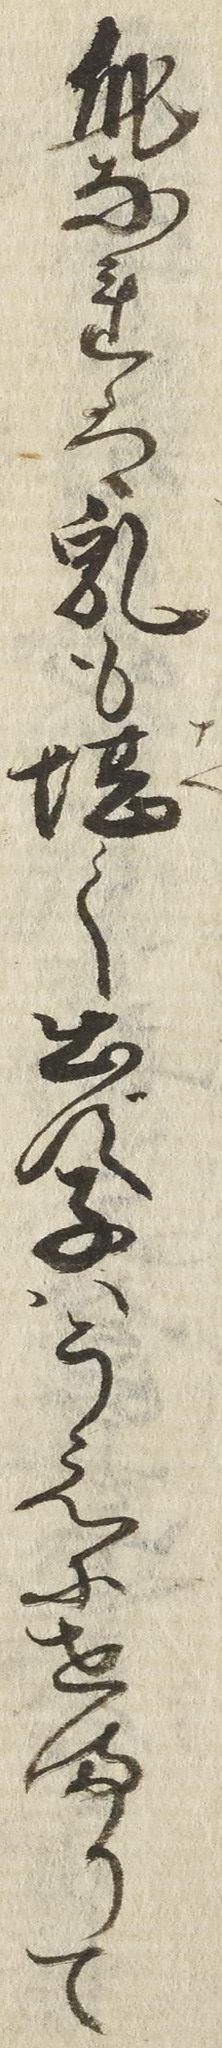身なれは乳も堪て出ず子はうえにせまりて
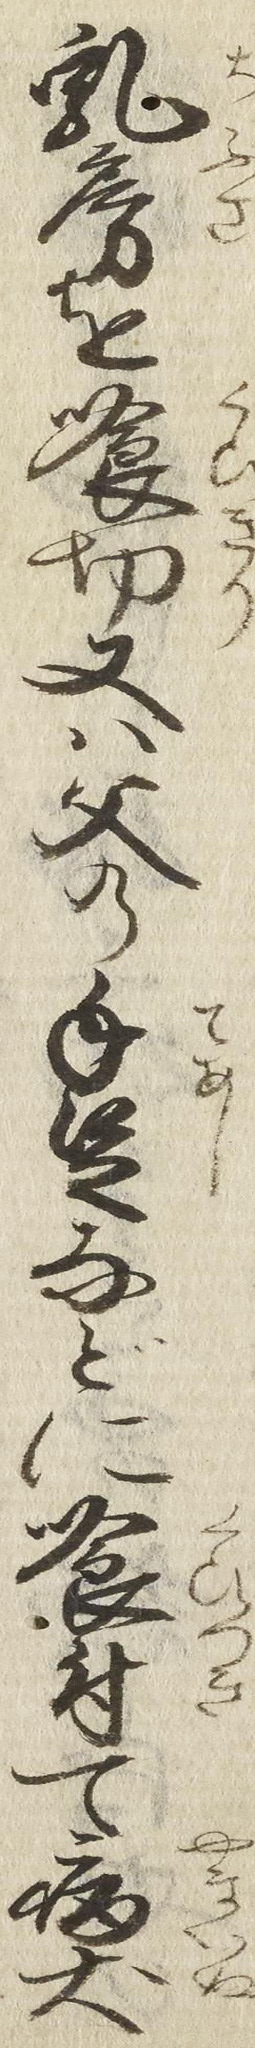乳房を喰切又は父の手足などに喰付て病犬
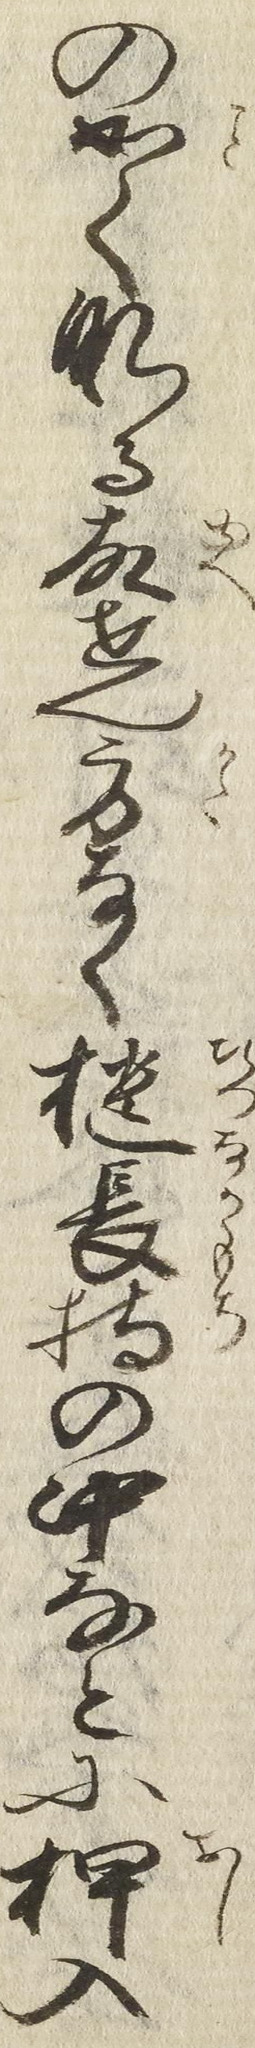の如くなる故せん方なく櫃長持の中なとに押入
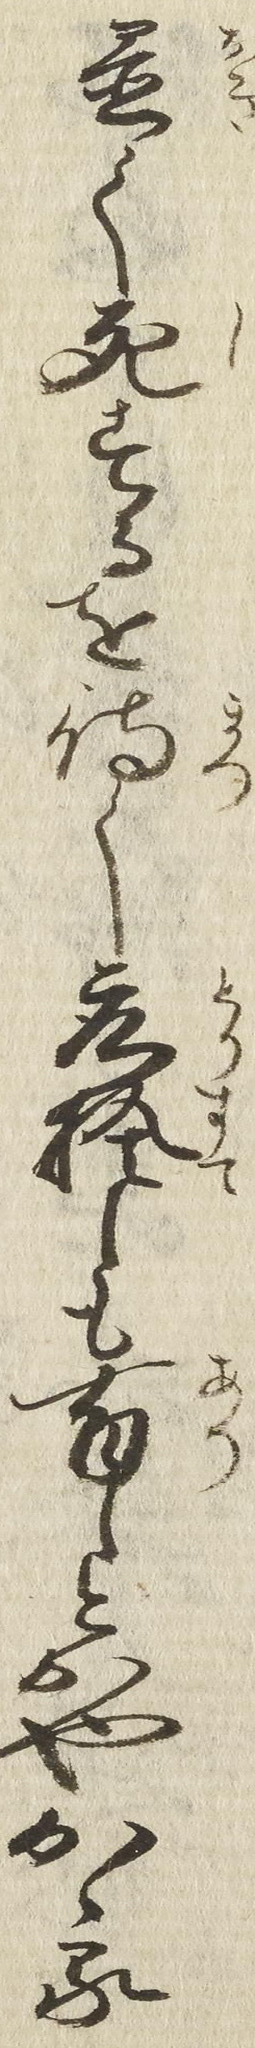置て死するを待て取捨しも有とかやかゝる
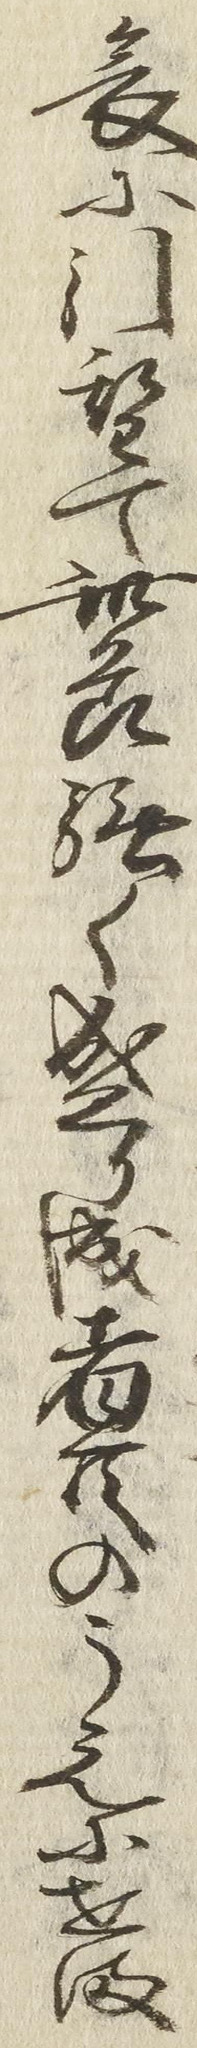哀に引替て此節強く盛り成者共のうえにせま
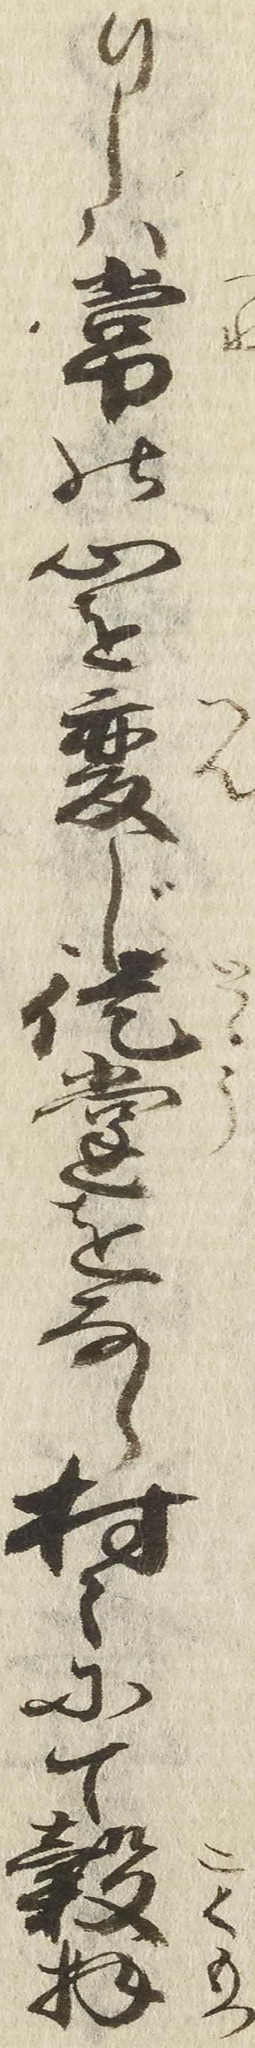りしは常の心を変じ徒党をなし村〻にて穀物
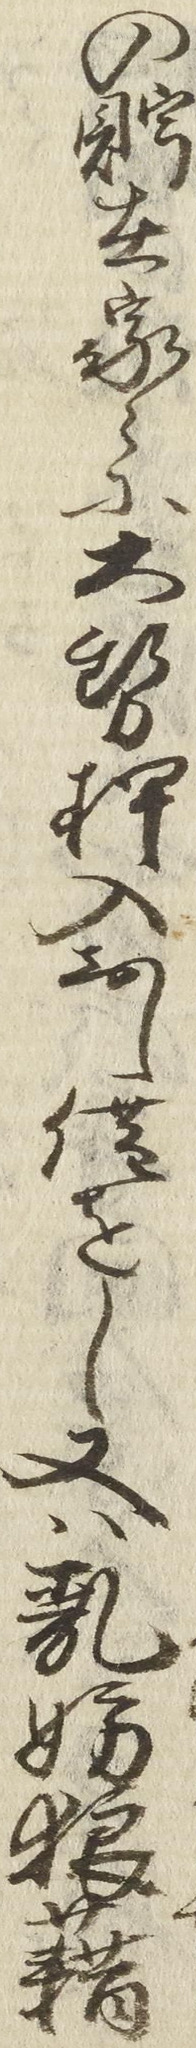の貯在家〻に大勢押入おし借をし又は乱妨狼藉
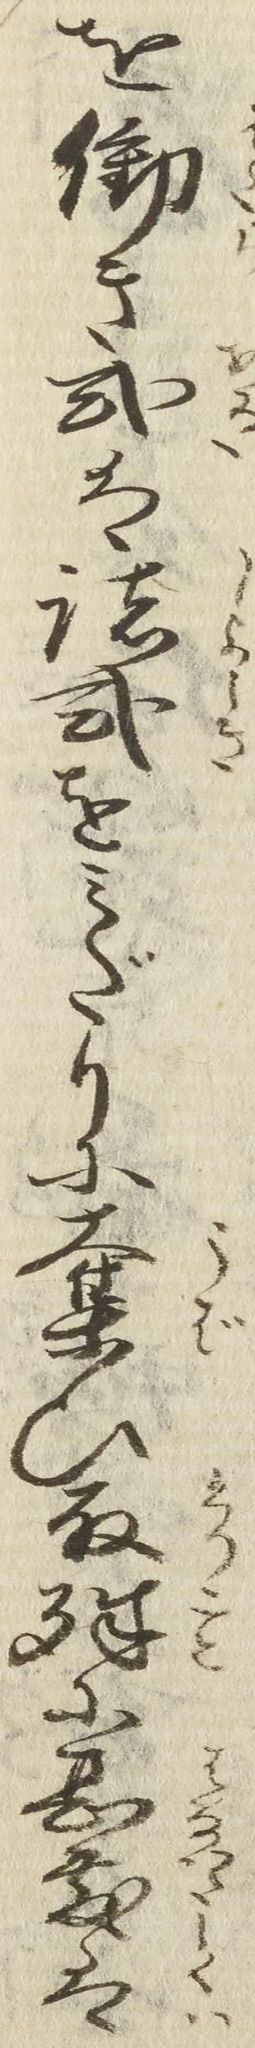を働き或は諸式をみだりに奪ひ取殊に甚敷盤
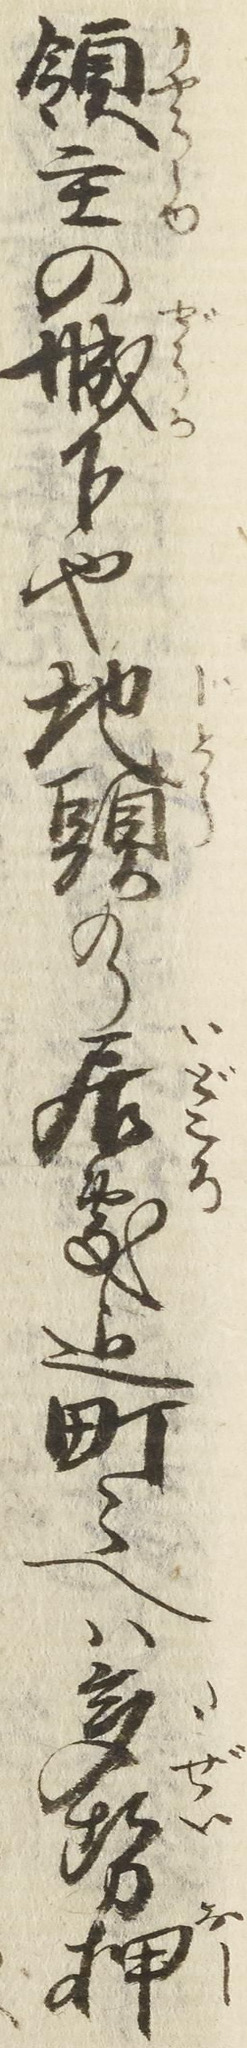領主の城下や地頭の居処迄町〻へは多勢押
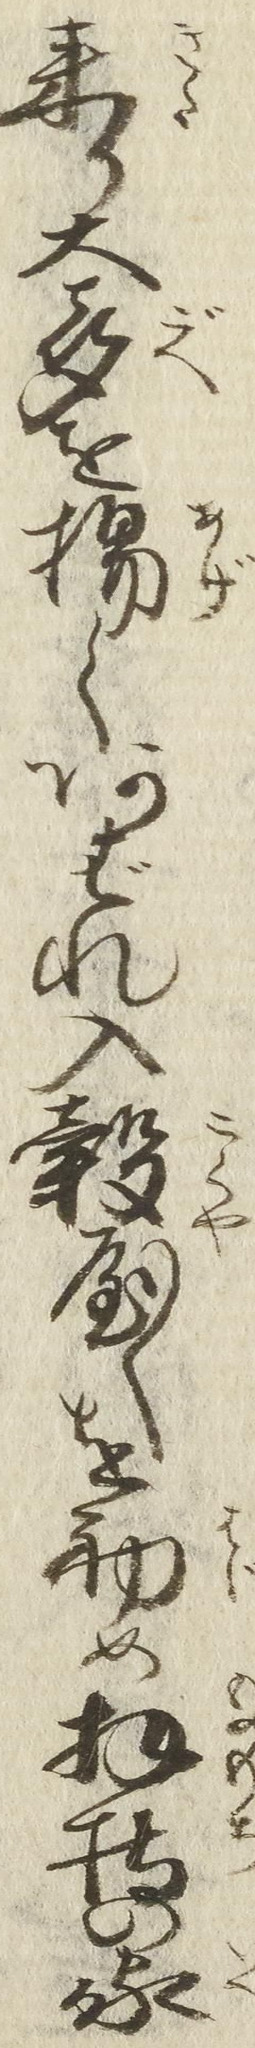来り大声を揚てあばれ入穀屋を初め物持の家
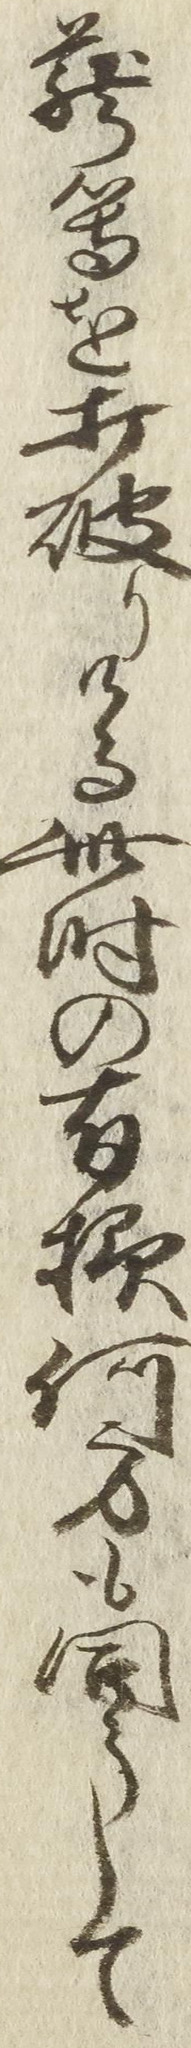蔵等を打破りける此時の有様何方も同うして
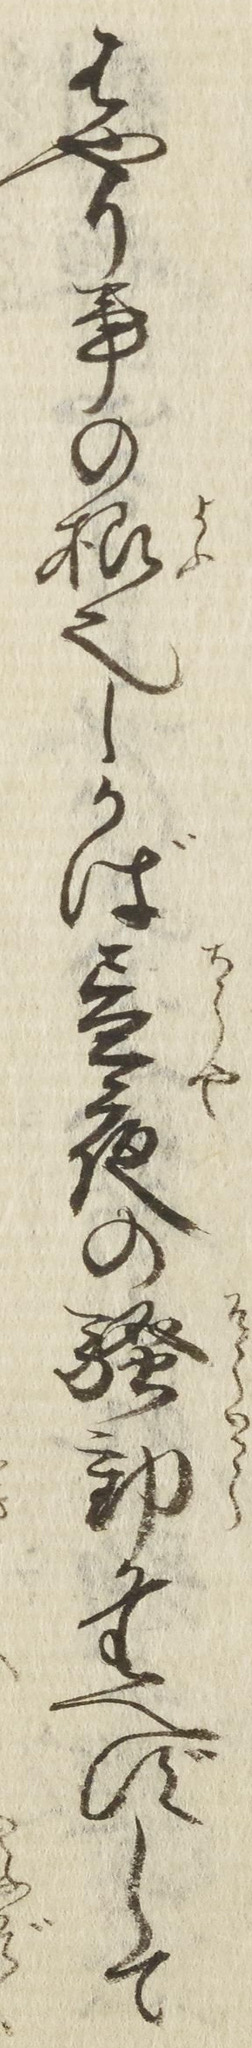はやり事の様也しかば昼夜の騒動たへずして
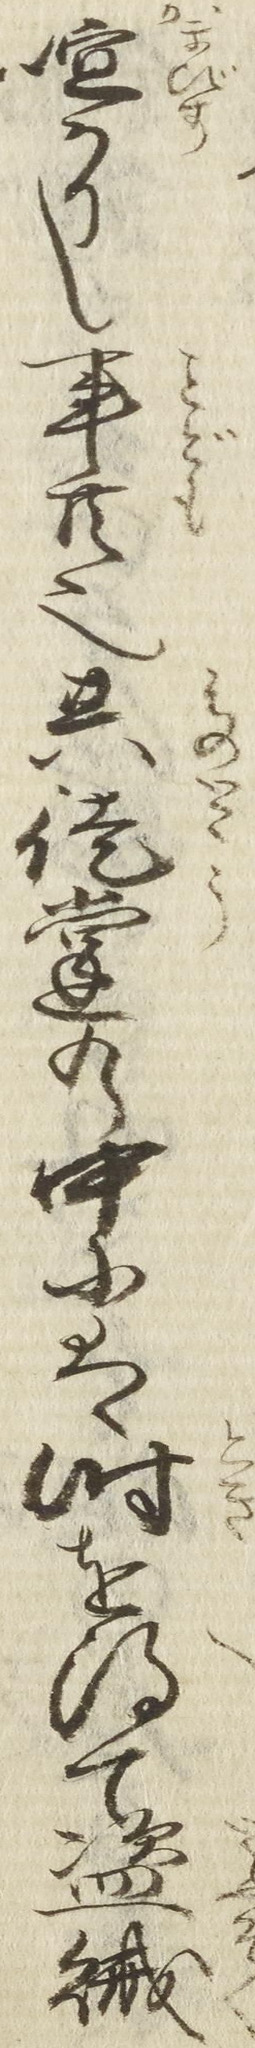喧かりし事共也其徒党の中には時を得て盗賊
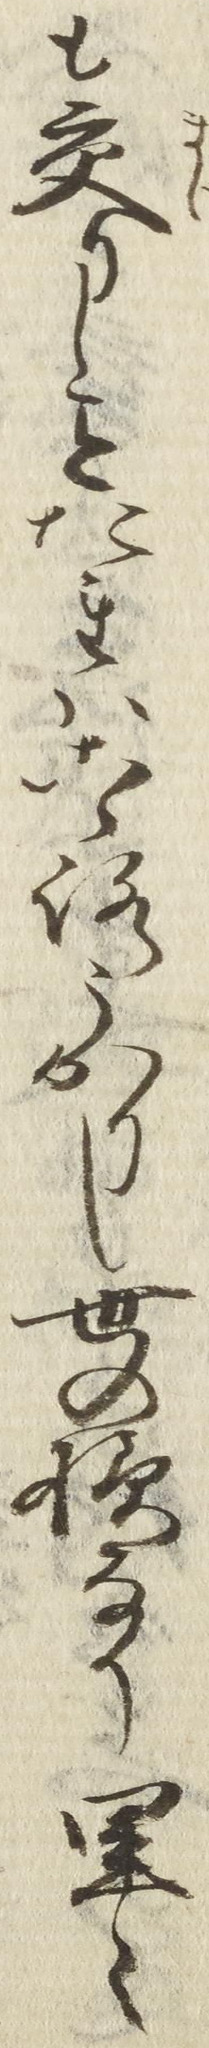も交りしことたれはこゝろうかりし世の様なり里〻
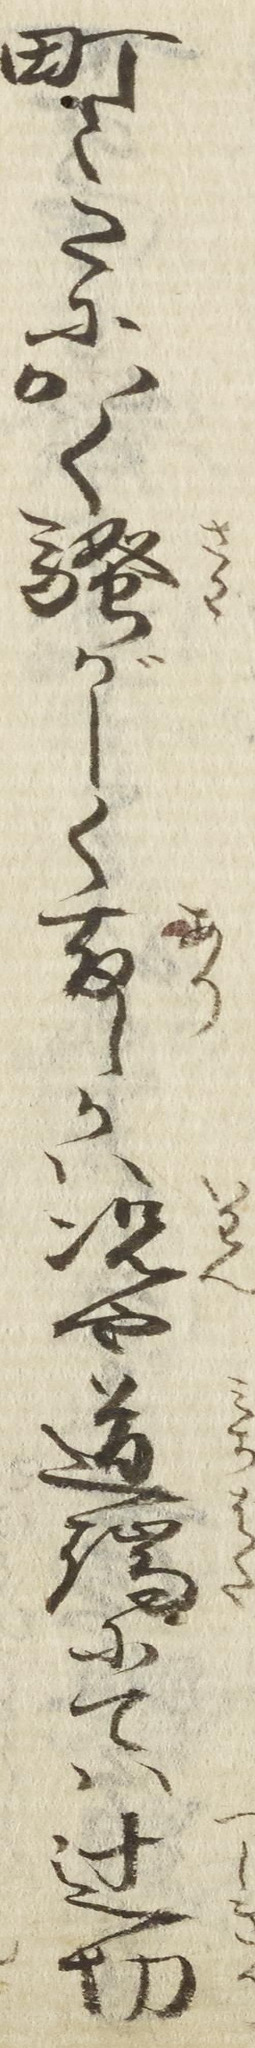町〻たにかく騒がしく有しかは況や道端にては辻切
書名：天明奇畧　全
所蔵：東京大学地震研究所図書室 Earthquake Research Institute Library, The University of Tokyo, JAPAN
